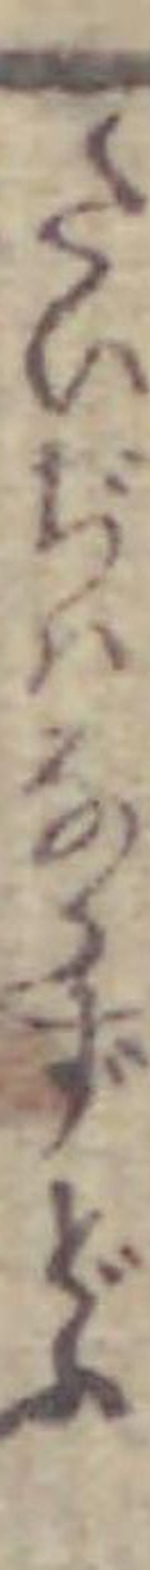たいぢはならずどふ
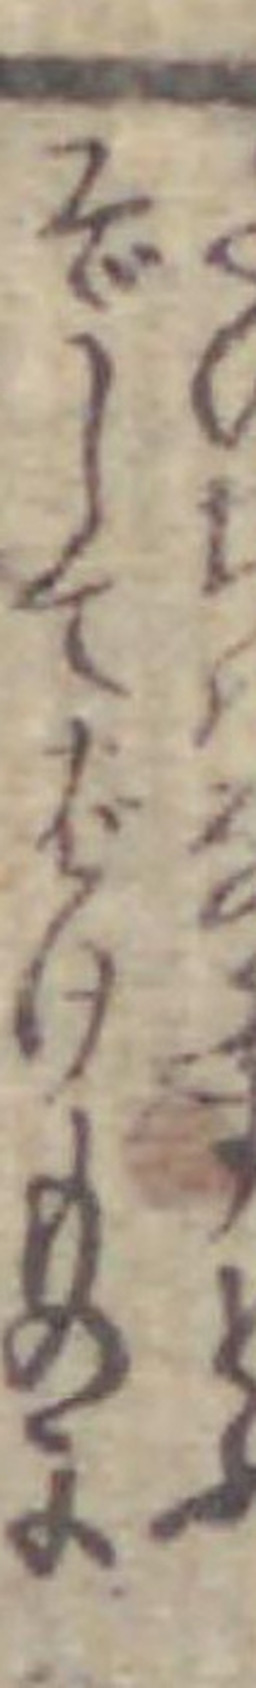ぞしてばけものに
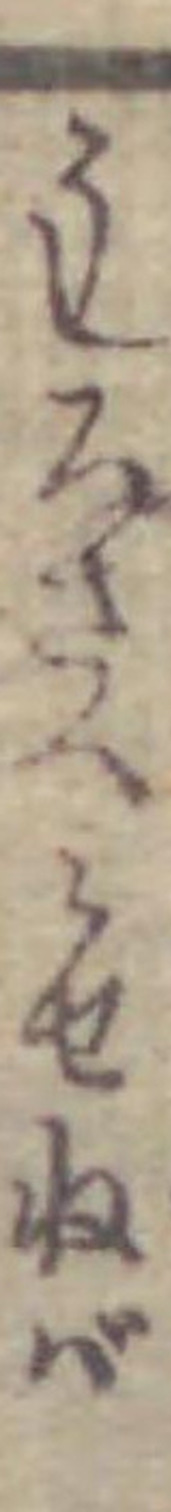うしろさへみせねば
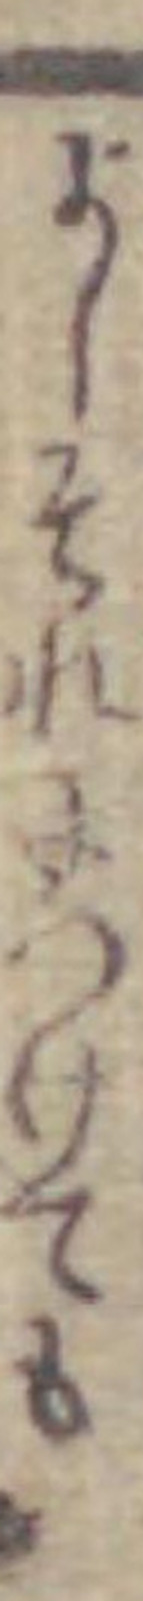よしそれにつけても
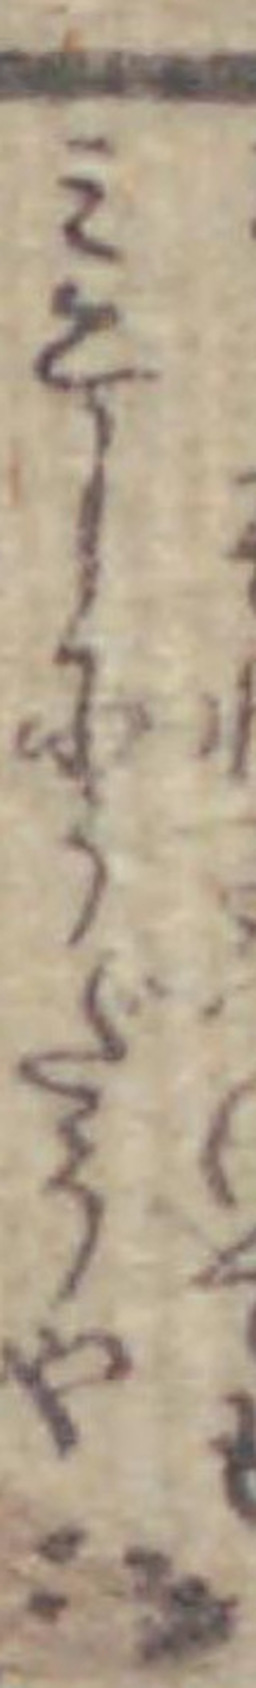みこしにうだうや
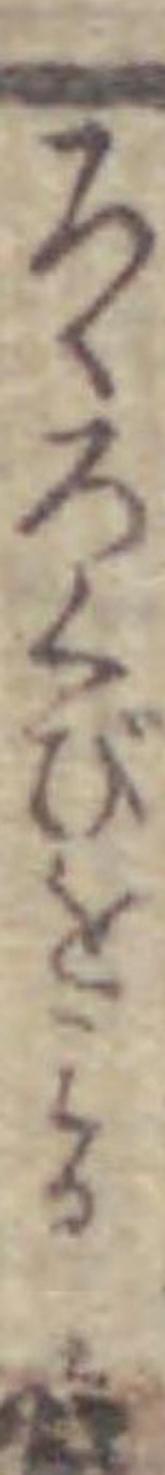ろくろくびをみる
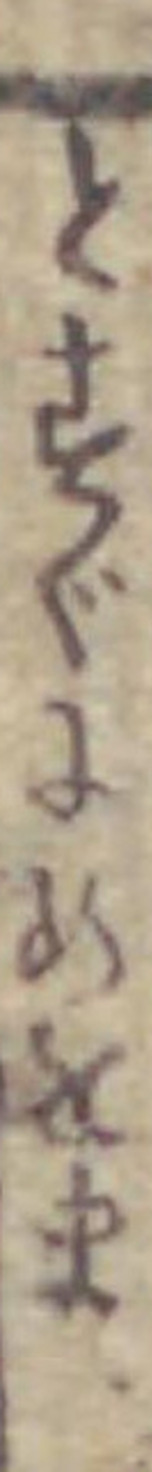とすぐにめをま
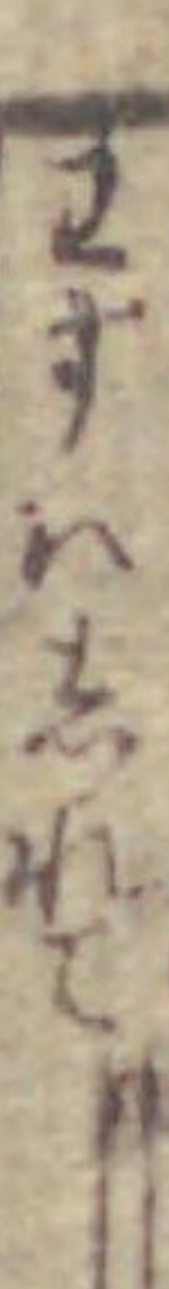わすはしれて
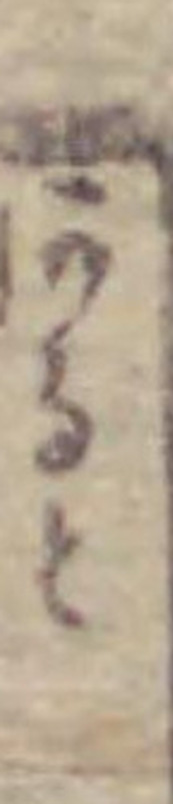あると
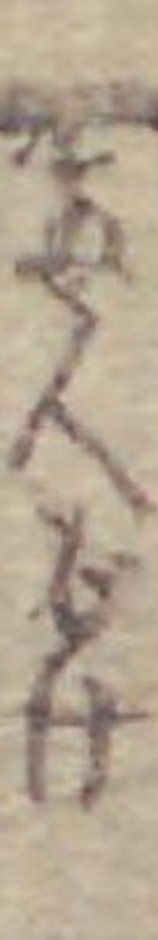両人ばけ
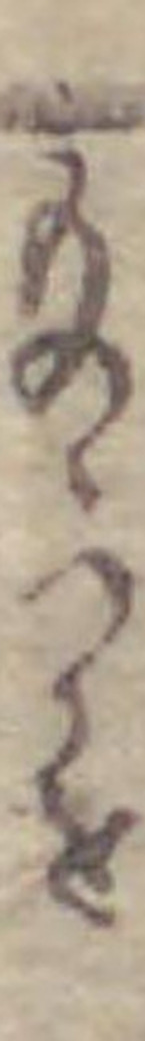ものゝつらを
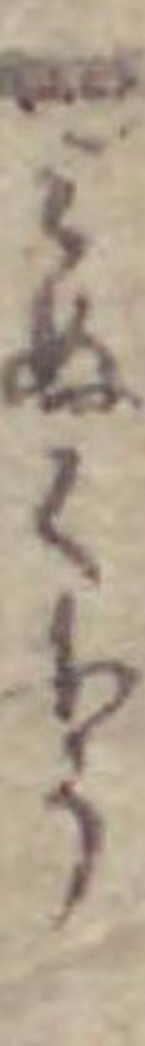みぬくふう
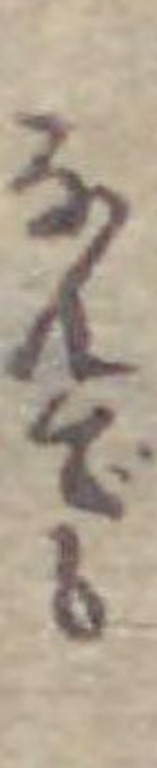なんでも
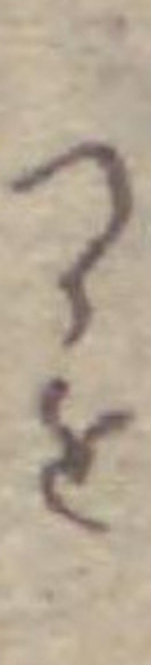つらを
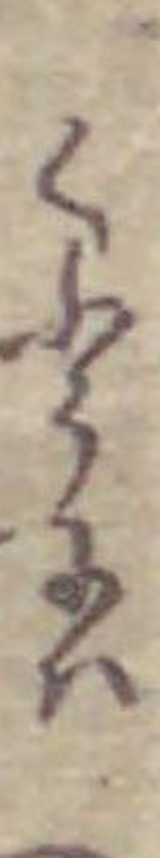くふうには
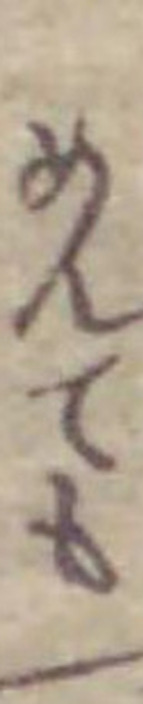めんても
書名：二日替 : 2巻
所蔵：国立国会図書館 National Diet Library, JAPAN
